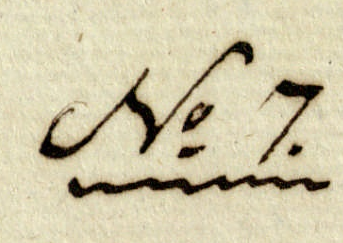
No 7.
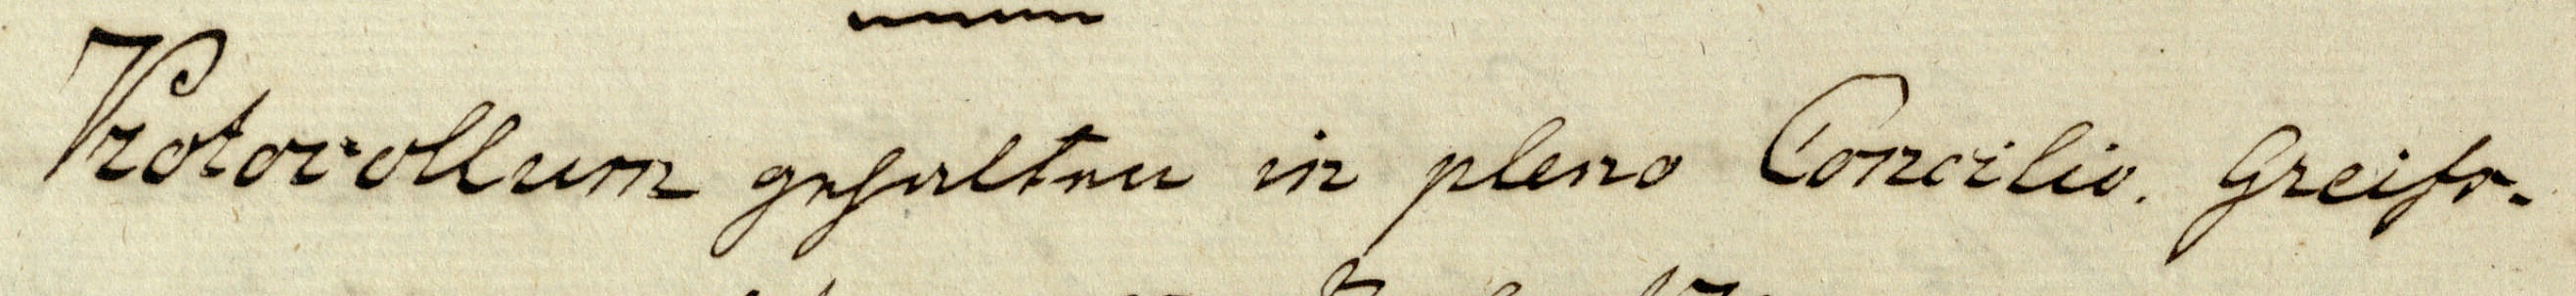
Protocollum gehalten in pleno Concilio. Greifs¬
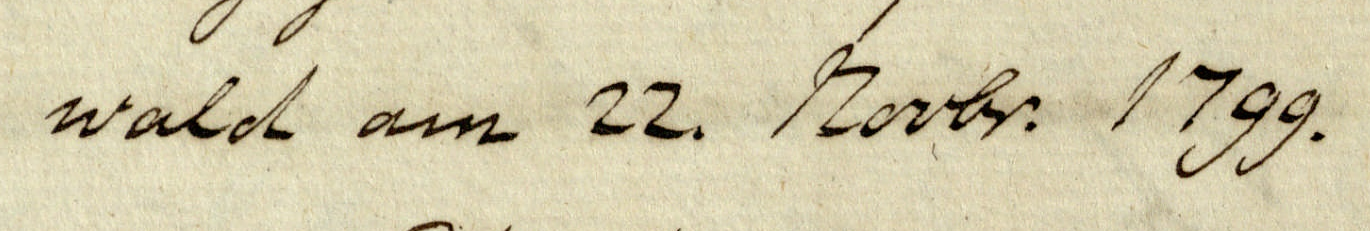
wald am 22. Novbr. 1799.
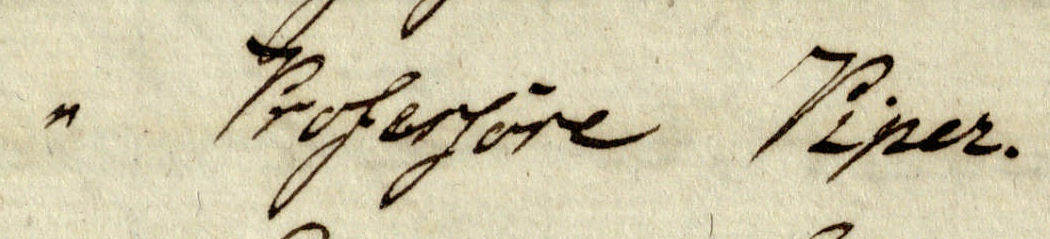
Professore Piper.
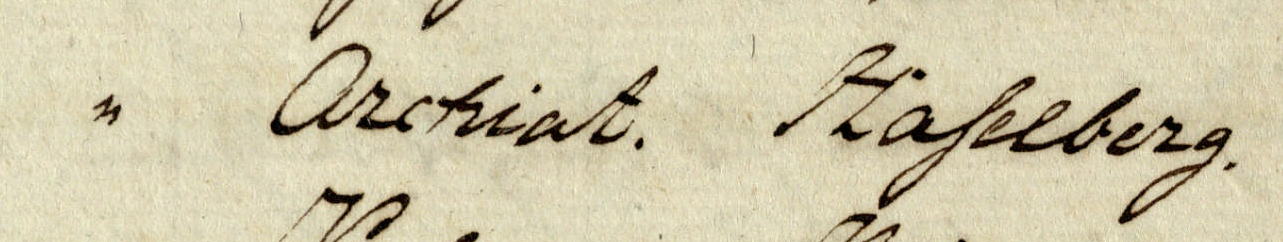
Archiat. Haselberg.
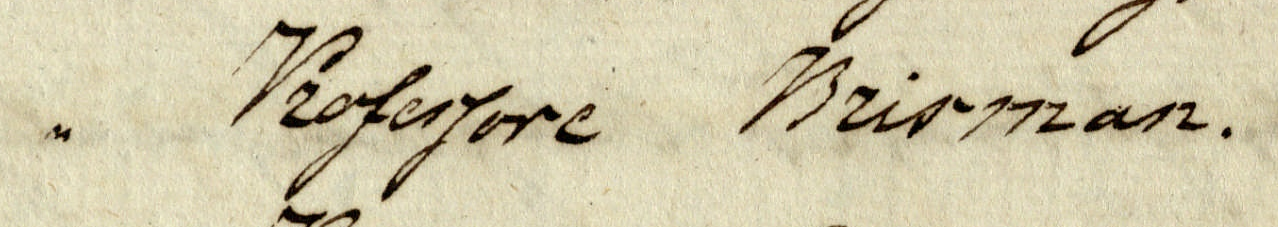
Professore Brisman.
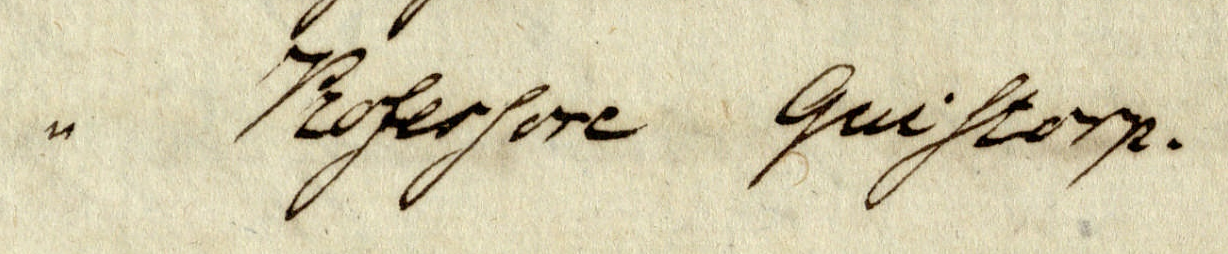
Professore Quistorp.
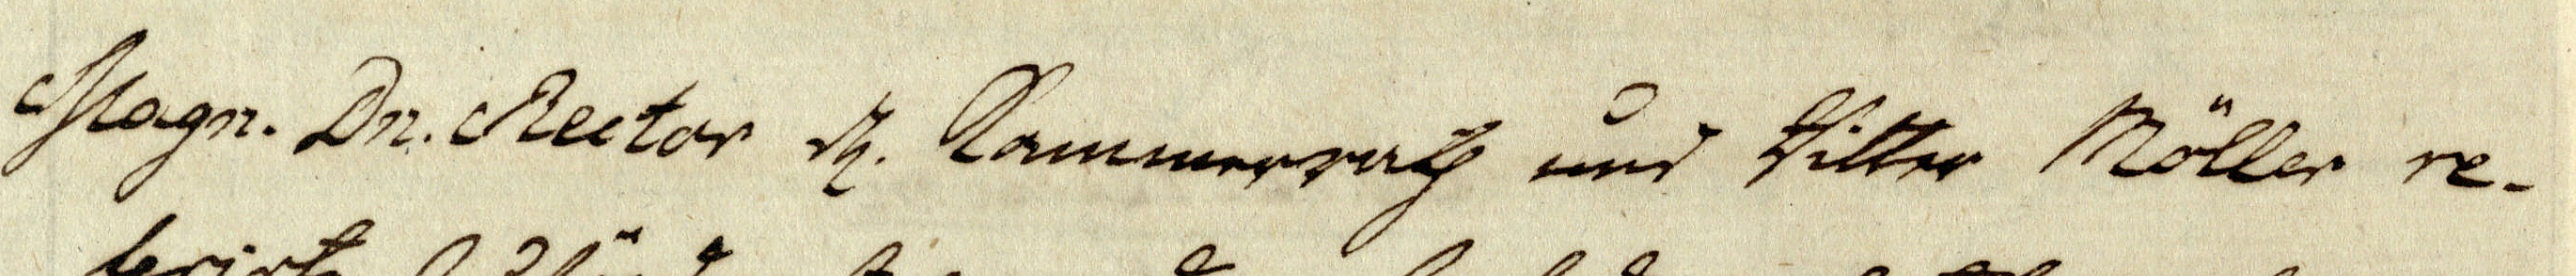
Magn. Dn. Rector dh. Kammerrath und Ritter Möller re¬
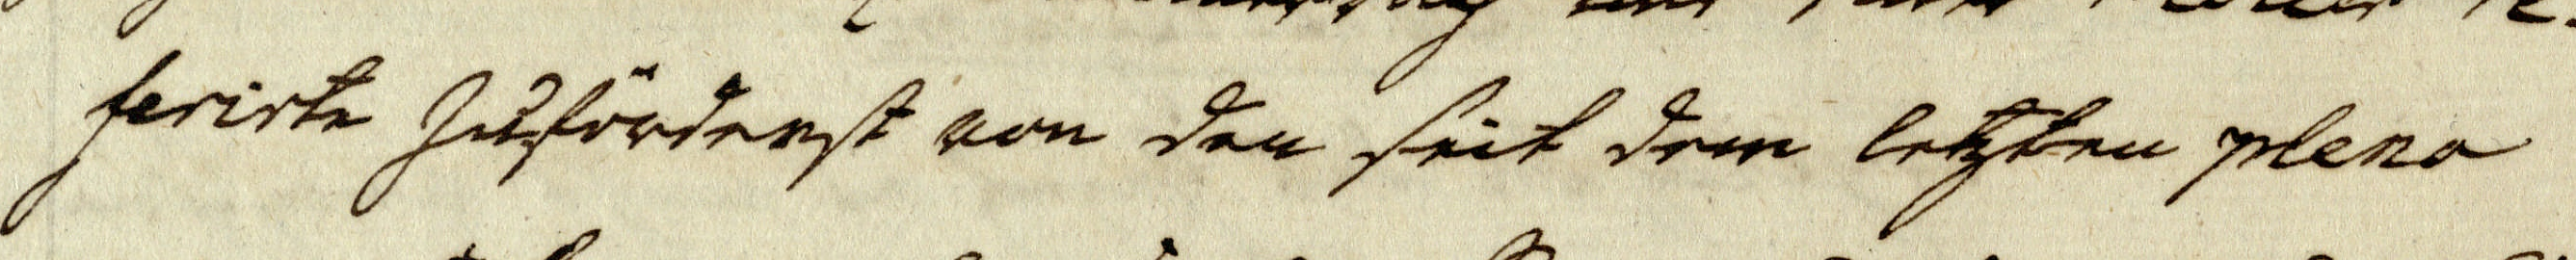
ferirte zuförderst von den seit dem letzten pleno
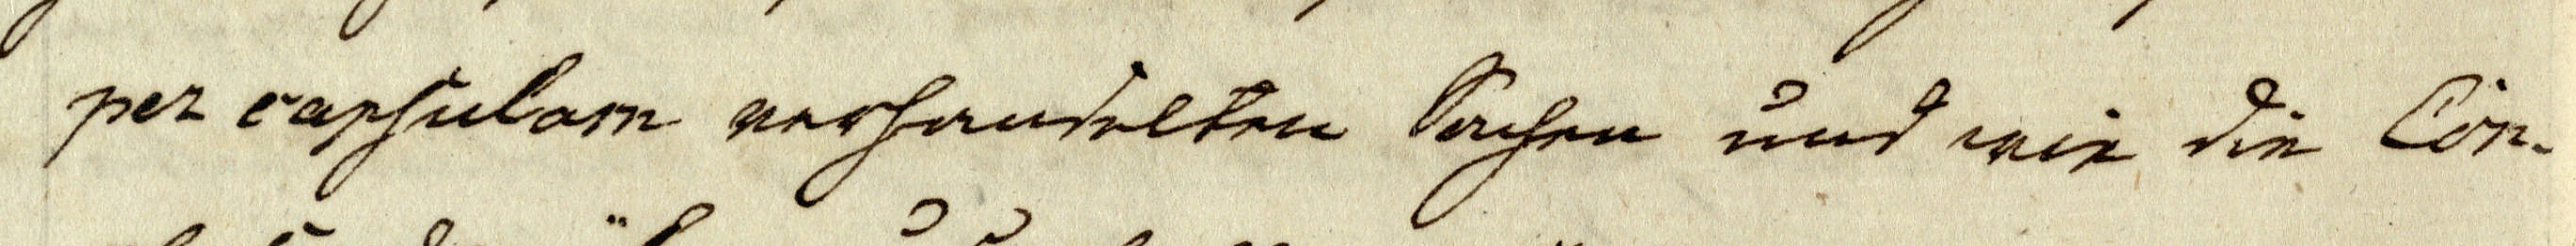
per capsulom verhandelten Sachen und wie die Con¬
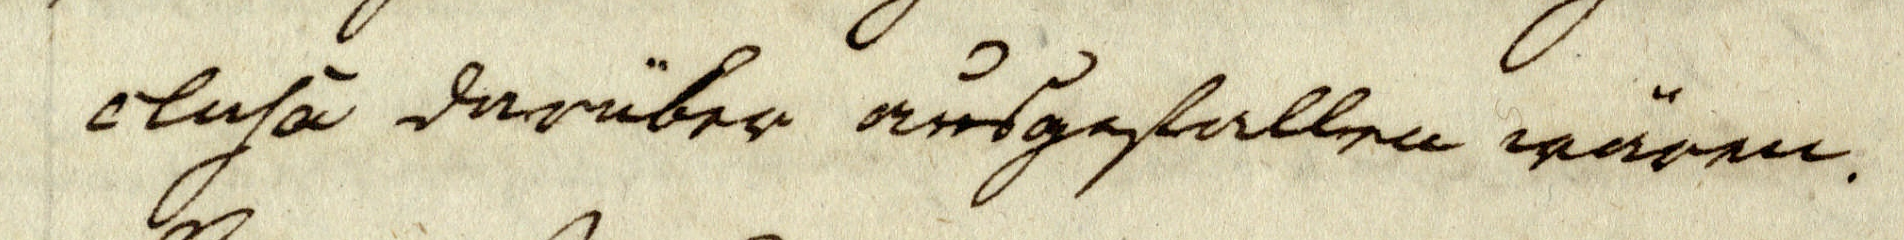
clusa darüber ausgefallen wären.
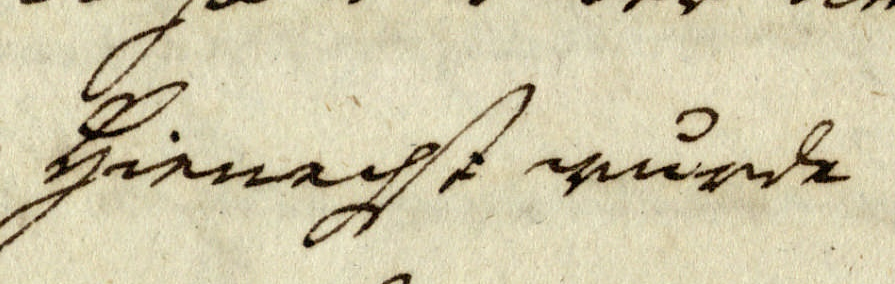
Hienechst wurde
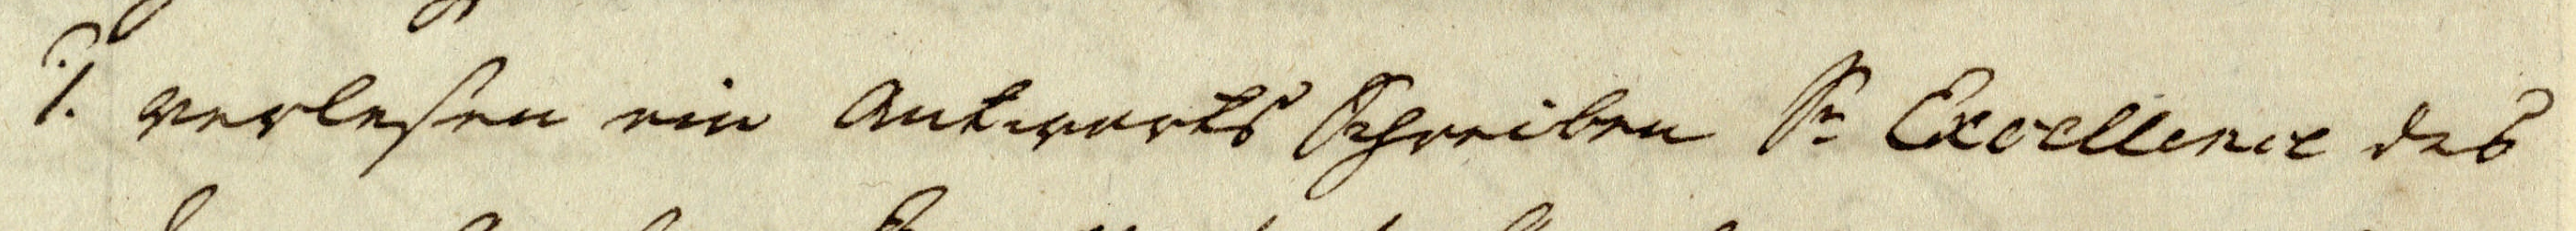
1. verlesen ein Antworts Schreiben Sr Excellence des
